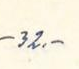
32
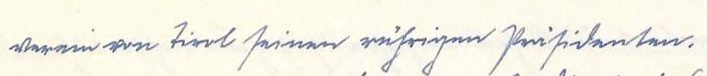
verein von Tirol seinen rührigen Präsidenten.
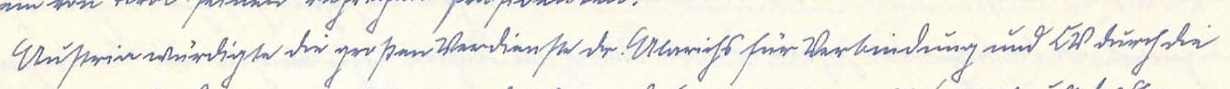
Austria würdigte die große Verdienste Dr. Alarichs für Verbindung und CV durch die
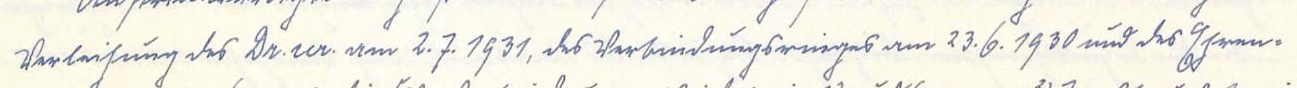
Verleihung des Dr. cer. am 2.7.1931, des Verbindungsringes am 23.6.1930 und des Ehren-
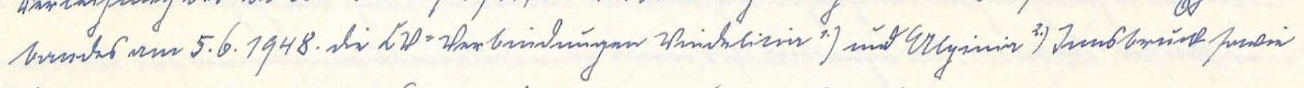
bandes am 5.6.1948. die CV-Verbindungen Vindelicia 1) und Alpinia 2) Innsbruck sowie
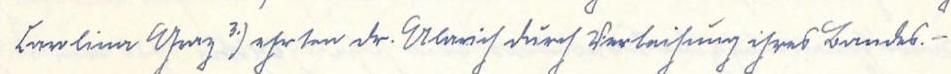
Carolina Graz 3) ehrten Dr. Alarich durch Verleihung ihres Bandes.
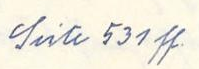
Seite 531 ff.
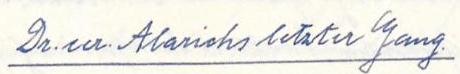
Dr. cer. Alarichs letzter Gang
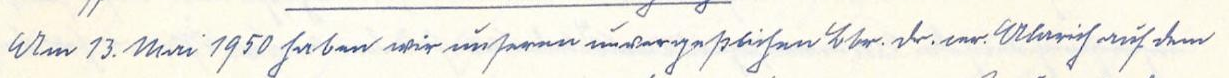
Am 13. Mai 1950 haben wir unseren unvergeßlichen Bbr. Alarich auf dem
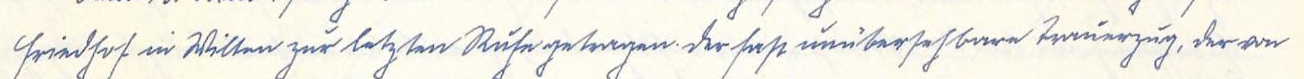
Friedhof in Wilten zur letzten Ruhe getragen. Der fast übersehbare Trauerzug, der an
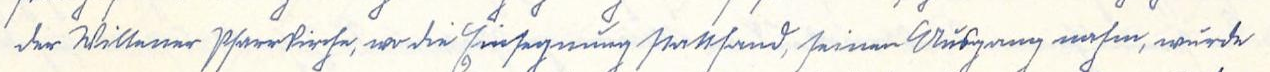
der Wiltener Pfarrkirche, wo die Einsegnung stattfand, seinen Ausgang nahm, wurde
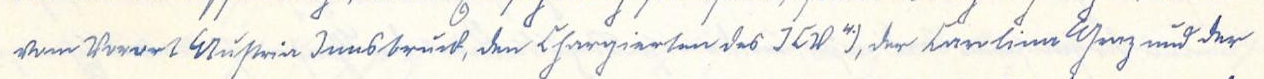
vom Vorort Austria Innsbruck, den Chargierten ICV 4)m der Carolina Graz und der
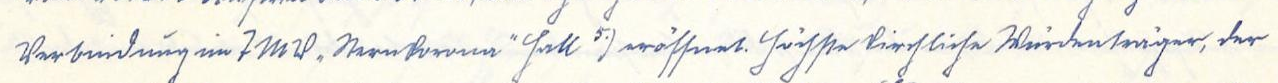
Verbindung im TMV „Sternkorona“ Hall 5) eröffnet. Höchste kirchliche Würdenträger, der
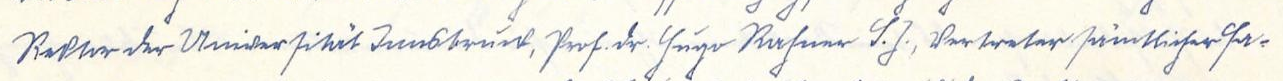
Rektor der Universität Innsbruck, Prof. Dr. Hugo Rahner S.J., Vertreter sämtlicher Fa-
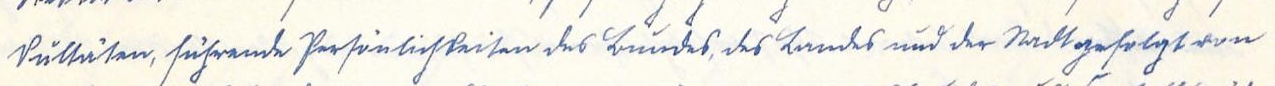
kultäten, führende Persönlichkeiten des Bundes, des Landes und der Stadt gefolgt von
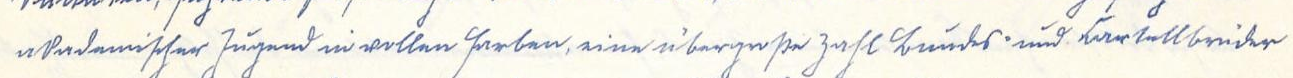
akademischer Jugend in vollen Farben, eine übergroße Zahl Bundes- und Cartellbrüder
